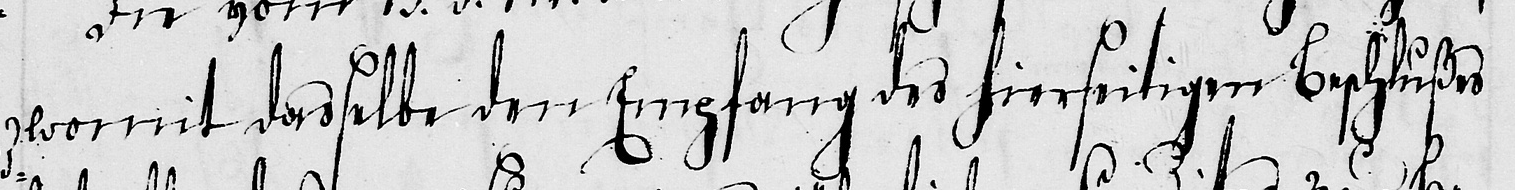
womit dasselbe den Empfang des hierseitigen Beschlußes
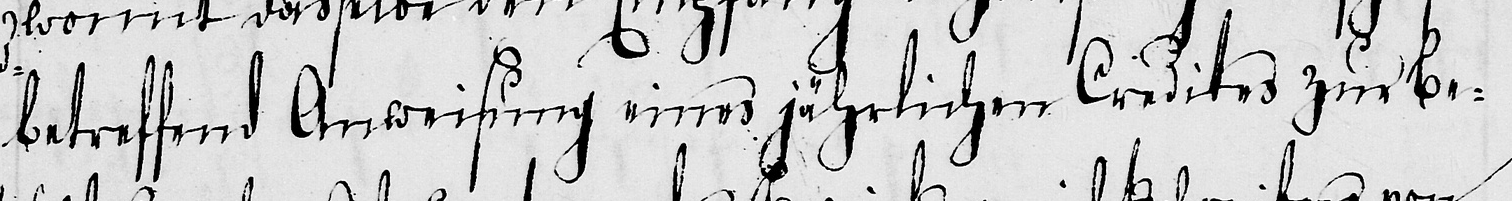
betreffend Anweisung eines jährlichen Credites zur Be¬
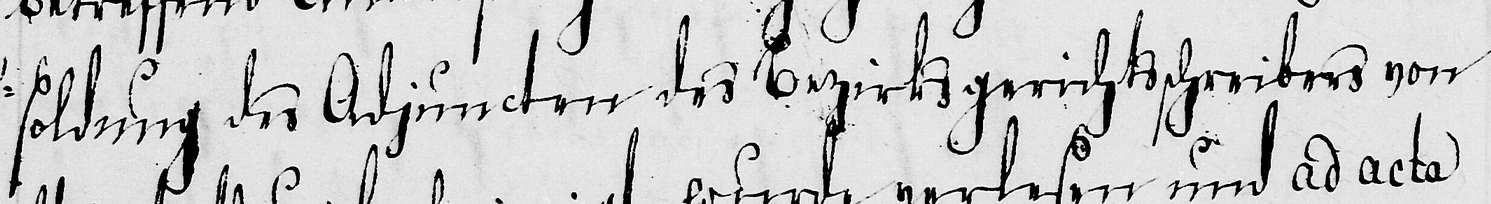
soldung des Adjuncten des Bezirksgerichtsschreibers von
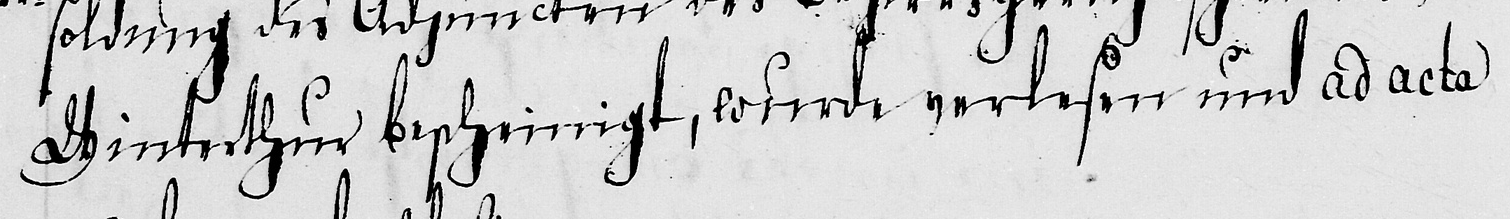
Winterthur bescheinigt, wurde verlesen und ad acta
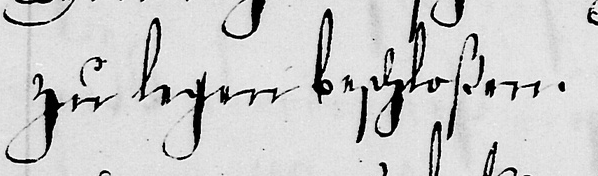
zu legen beschloßen.
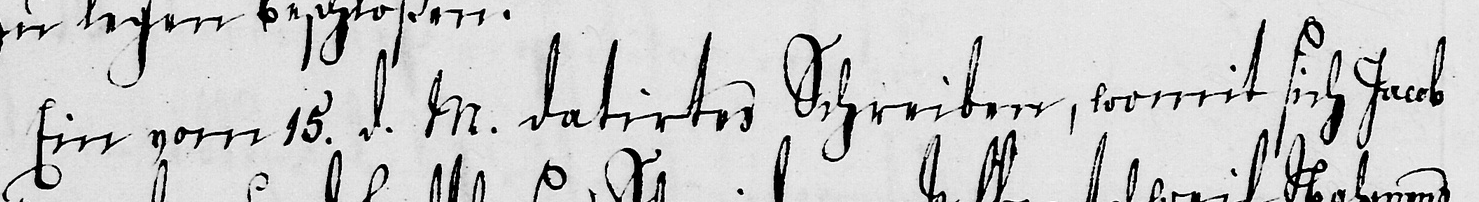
Ein vom 15. d. M. datirtes Schreiben, womit sich Jacob
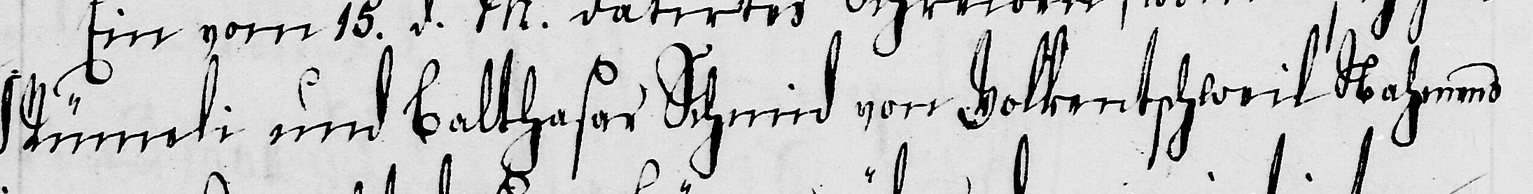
Rümeli und Balthasar Schmid von Volkentschweil Nahmens
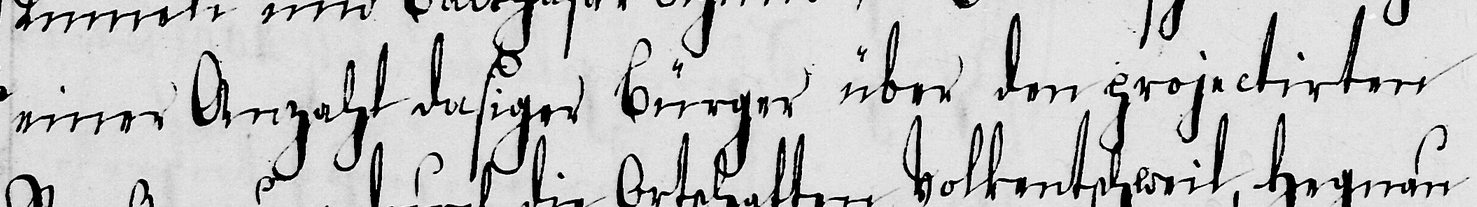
einer Anzahl dasiger Bürger über den projectirten
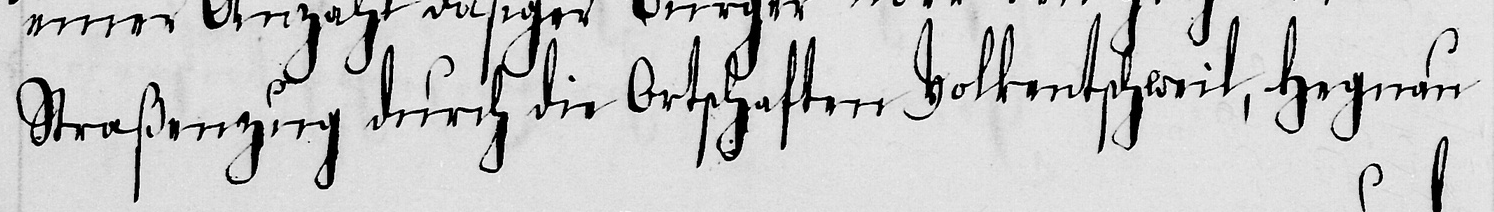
Straßenzug durch die Ortschaften Volkentschweil, Hegnau
